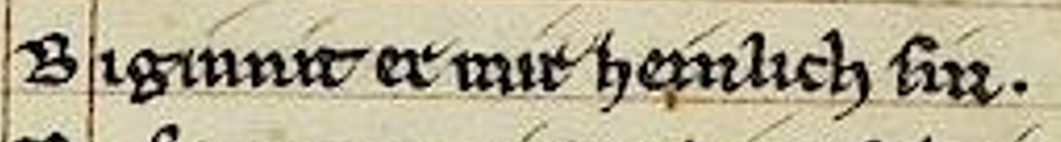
Biginnit er mir heinlich ſin.
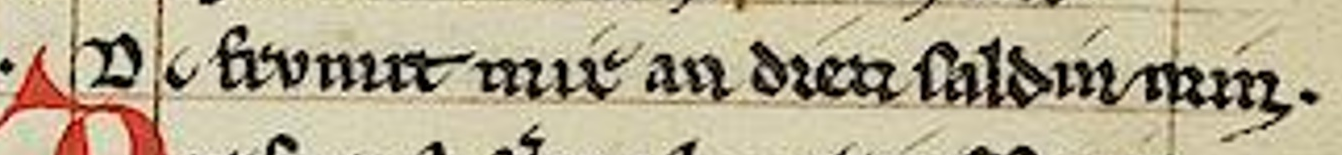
D(az) frvmit mir an dien ſaldin min.
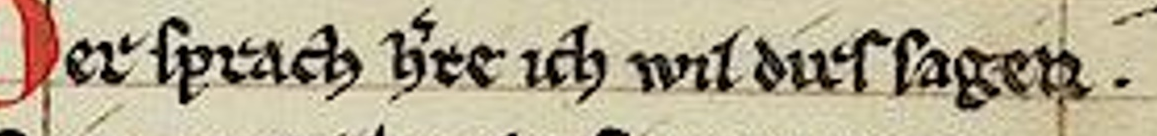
*Der ſprach h(er)re ich wil dirſ ſagen.
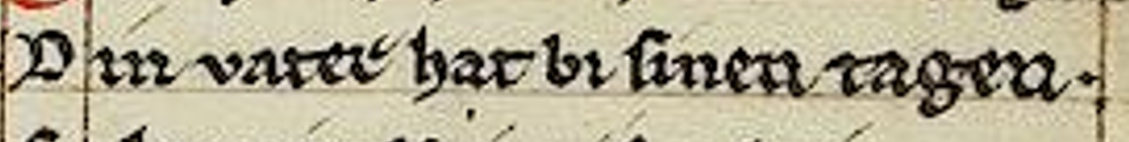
Din vater hat bi ſinen tagen.
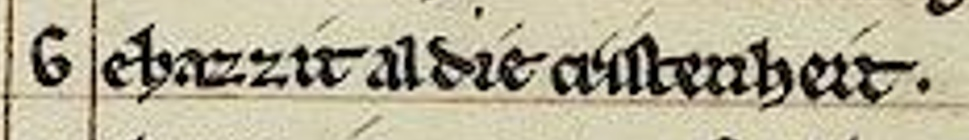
Gehazzit al die criſtenheit.
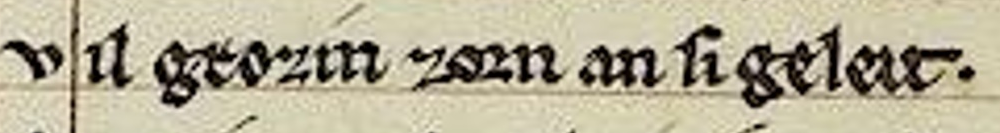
Vil grozin zorn an ſi geleit.
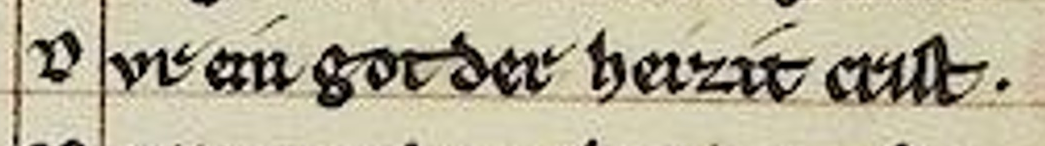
Dvr ein got der heizit criſt.
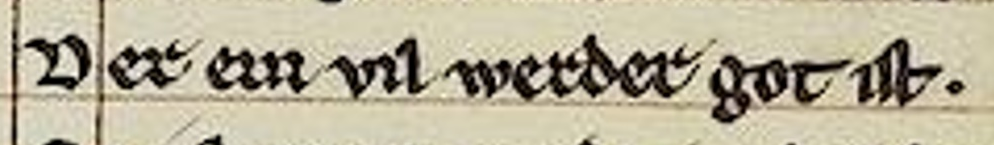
Der ein vil werder got iſt.
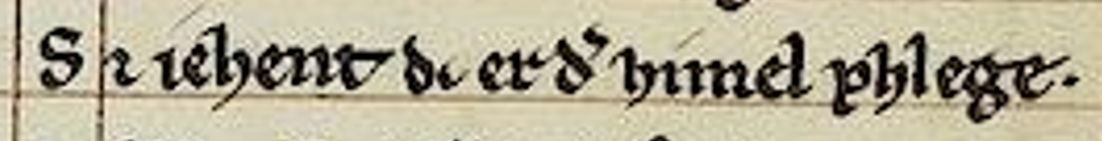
Sie iehent d(az) er d(er) himel phlege.
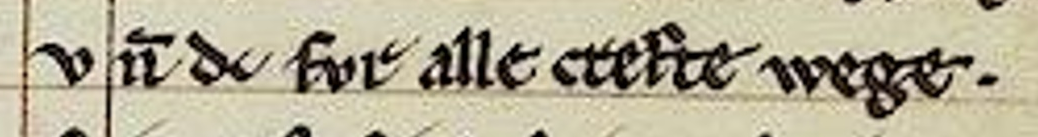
Vn(d) d(az) fvr alle crefte wege.
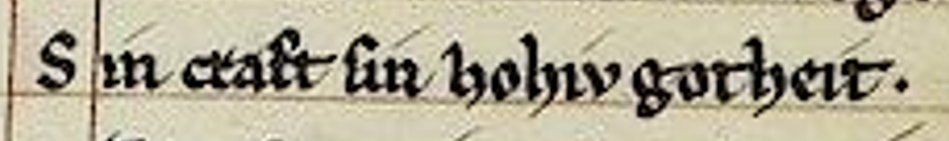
Sin craft ſin hohiv gotheit.
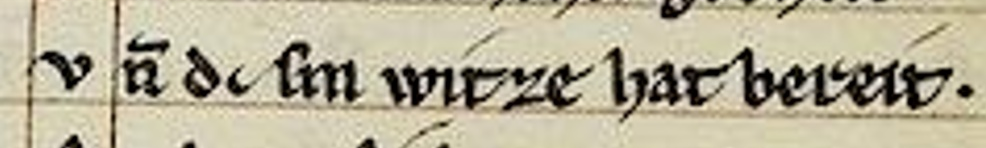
Vn(d) d(az) ſin witze hat bereit.
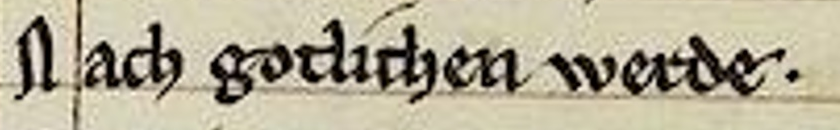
Nach gotlichen werde.
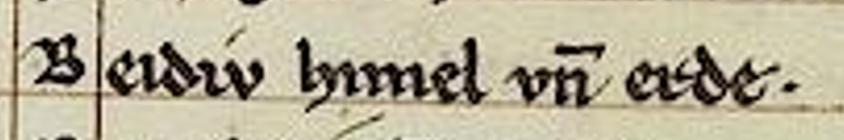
Beidiv himel vn(d) erde.
